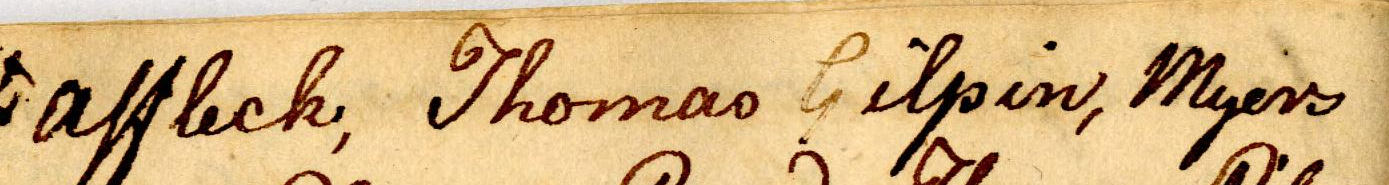Affleck, Thomas Gilpin, Myers
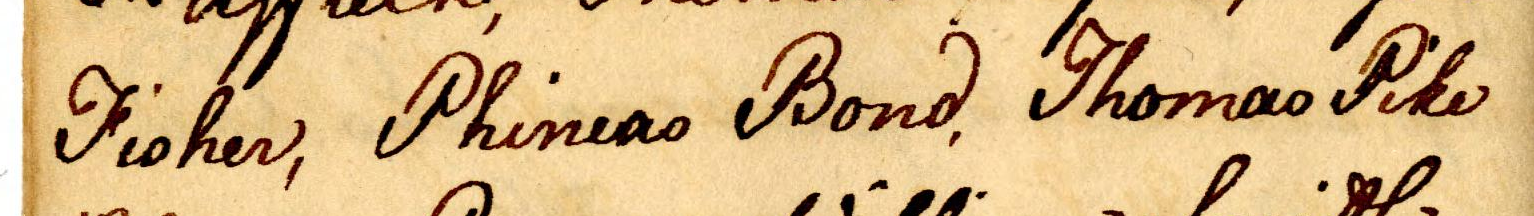Fisher, Phineas Bond, Thomas Pike
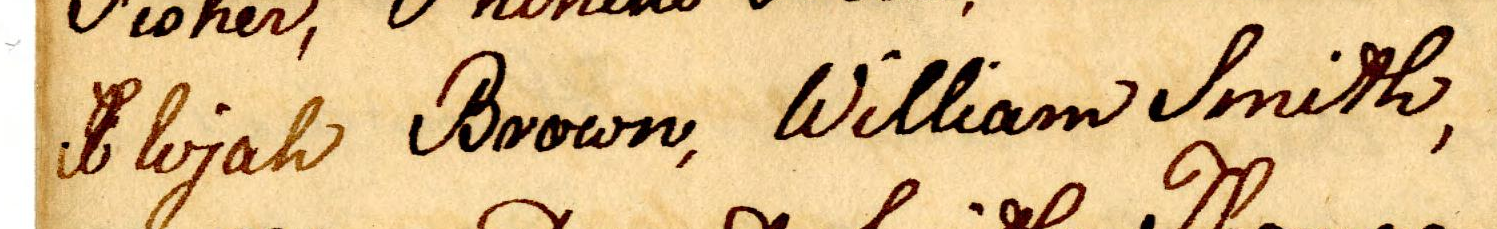Elijah Brown, William Smith,
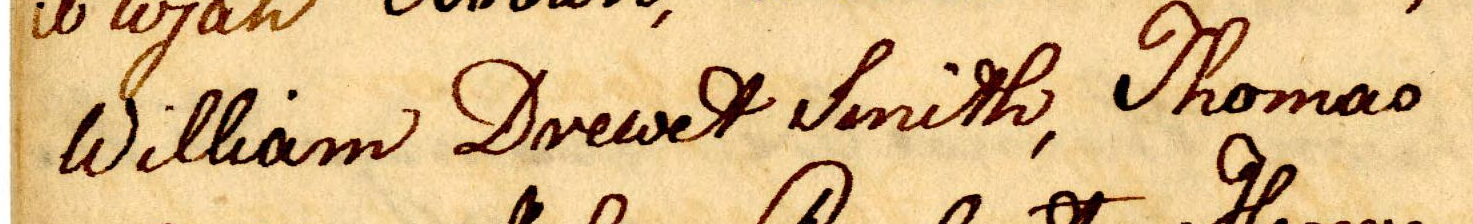William Drewet Smith, Thomas
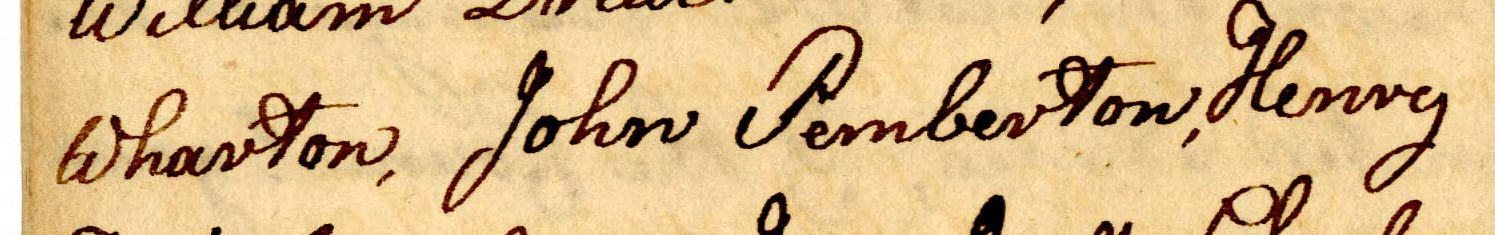Wharton, John Pemberton, Henry
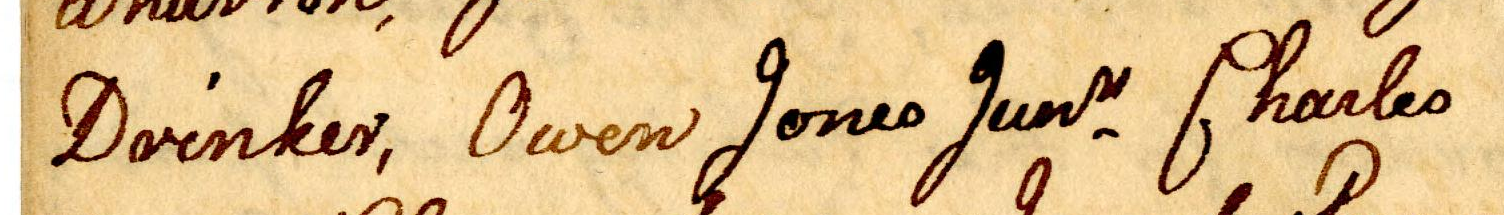Drinker, Owen Jones Jun^r. Charles
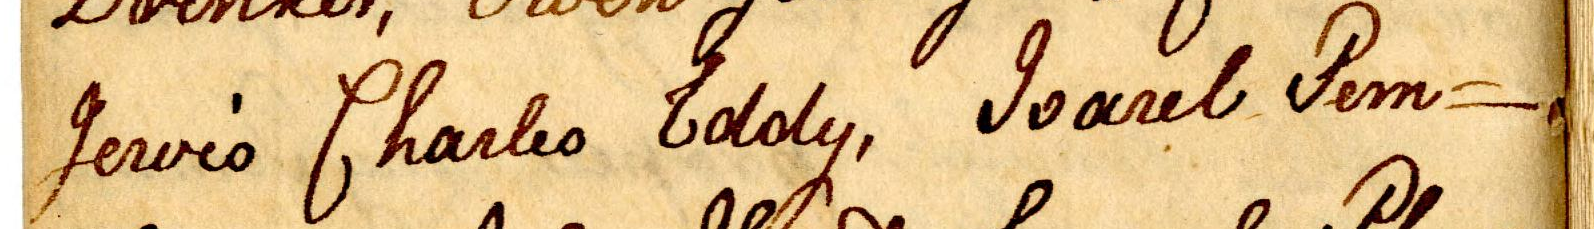Jervis Charles Eddy, Isarel Pem-
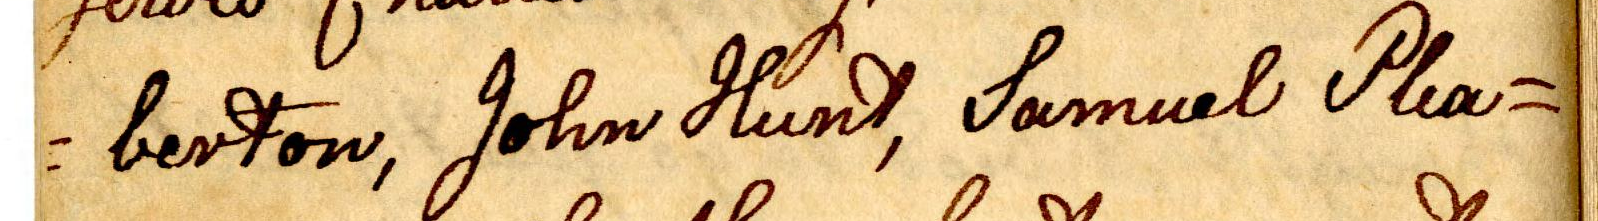-berton, John Hunt, Samuel Plea-
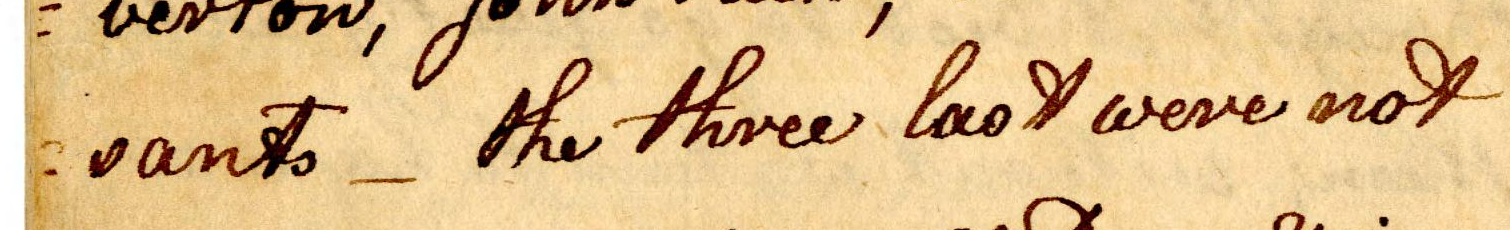-sants- the three last were not
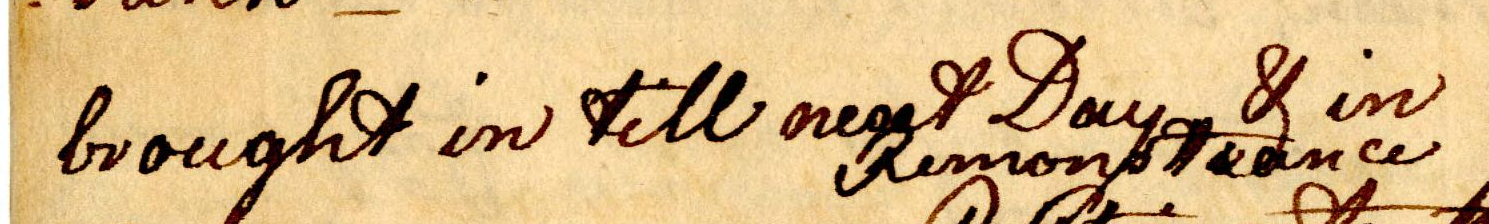brought in till next Day & in
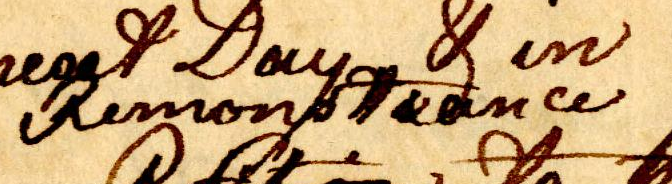Remonstrance
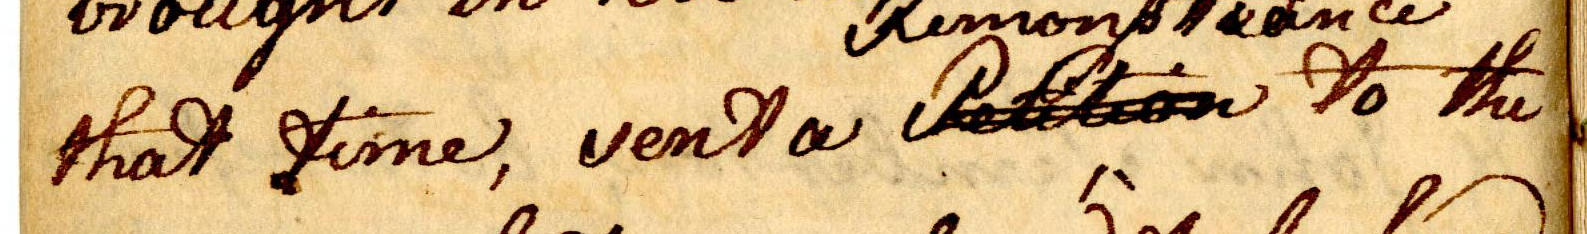that time, sent a [Petition] ^ to the
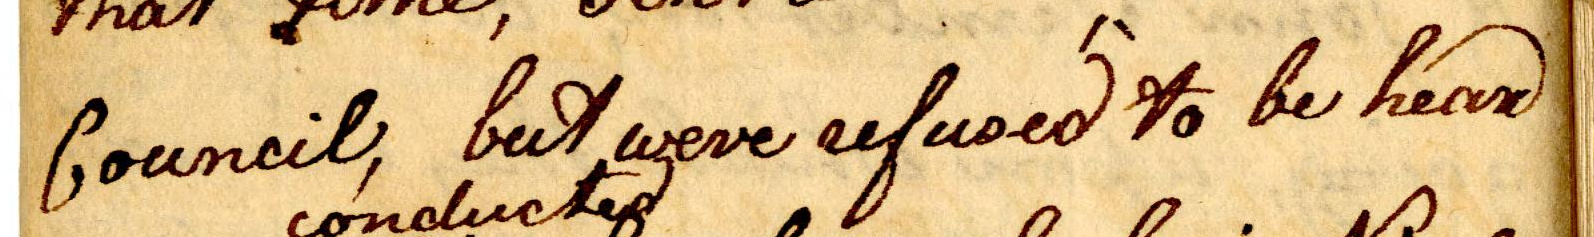Council, but were refused to be heard
